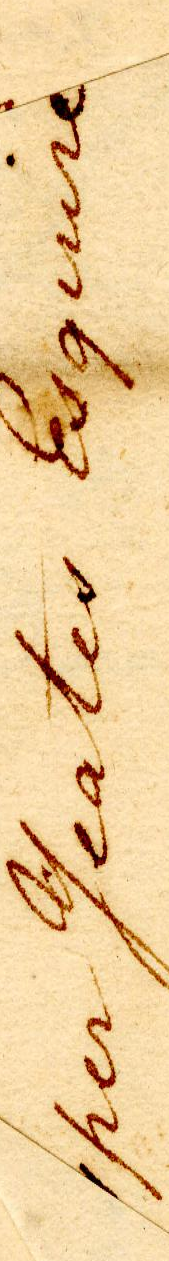-per Yeates Esquire
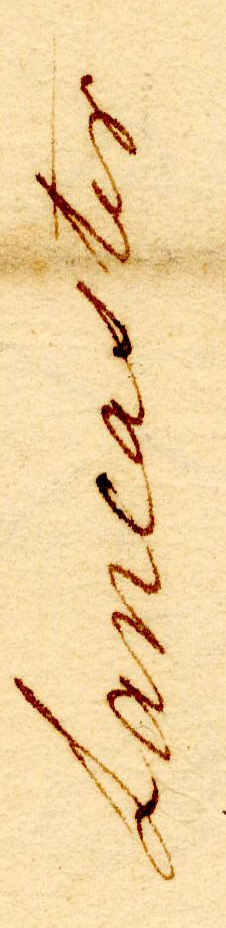Lancaster
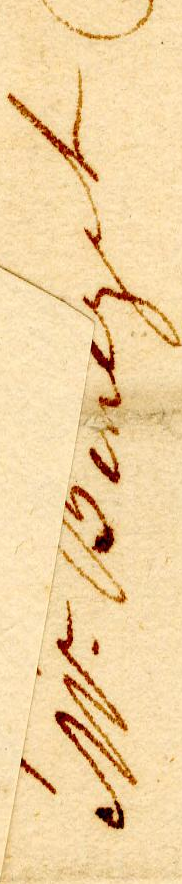M^r. Benezet
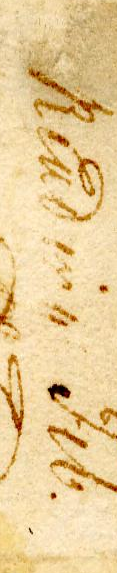Reading Feb.
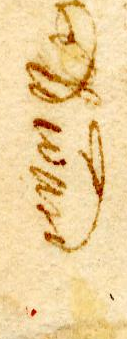Edward
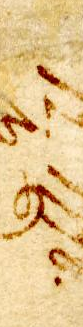12. 1778.
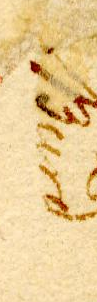Burd
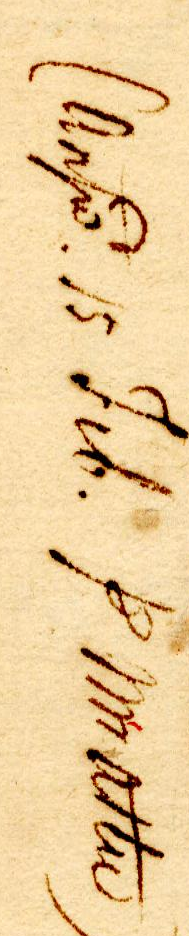(Answ^d. 15 Feb. per M^r Atter)
